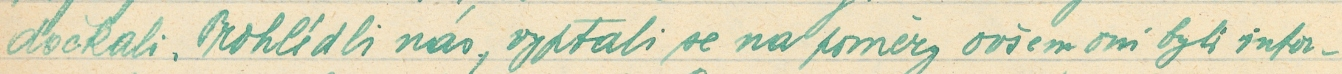dočkali. Prohlédli nás, vyptali se na poměry ovšem oni byli infor-
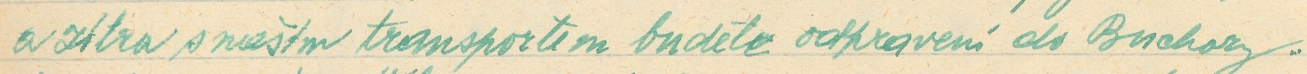a zítra s naším transportem budete odpravení do Buchary.
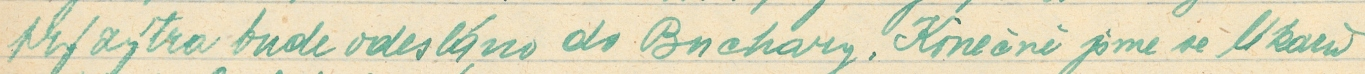prý zýtra bude odesláno do Buchary. Konečně jsme se lékařů
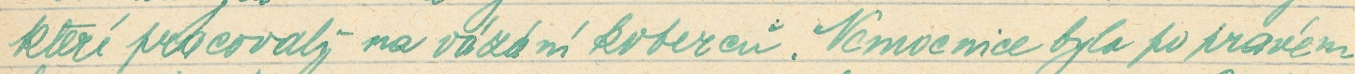které pracovaly na vázání koberců. Nemocnice byla po pravém
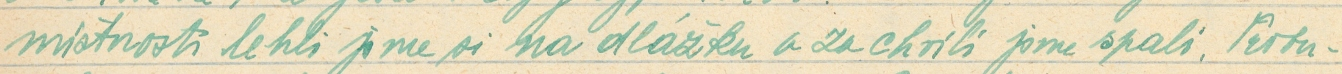místnosti lehli jsme si na dlážku a za chvílí jsme spali. Probu-
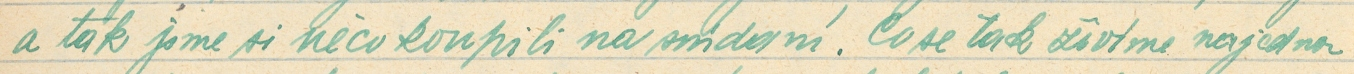a tak jsme si něco koupili na snídaní. Co se tak živíme najednou
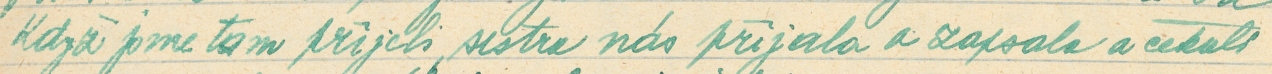Když jsme tam přijeli, sestra nás přijala a zapsala a čekali
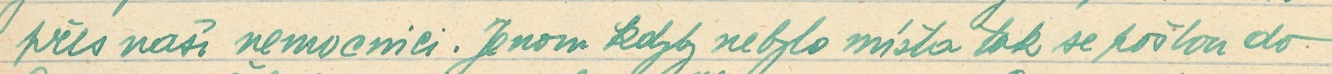přes naší nemocnici. Jenom kdyby nebylo místa tak se pošlou do
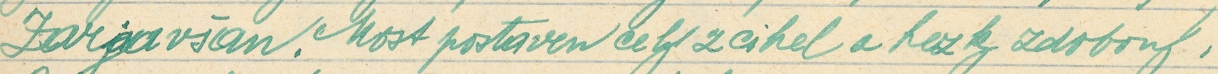Zarjavšan. Most postaven celý z cihel a hezky zdobený,
